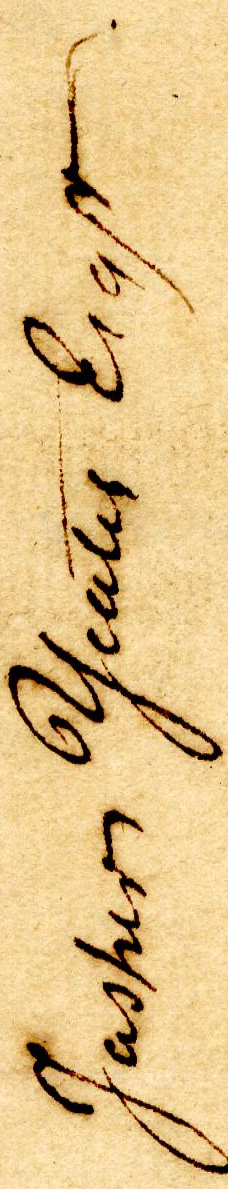Jasper Yeates Esq^r
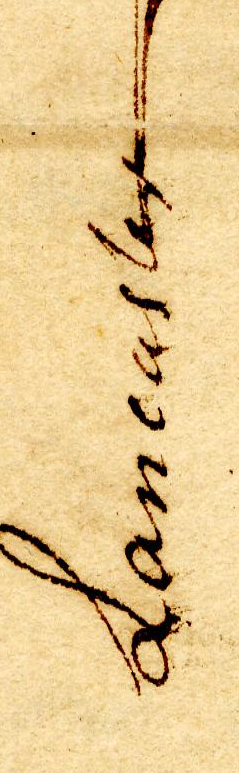Lancaster
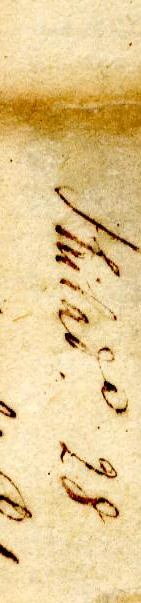Philad^a. 28
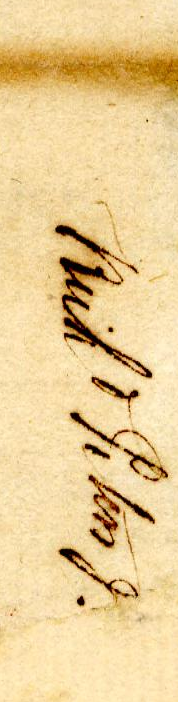Rich^d Peters Jr.
